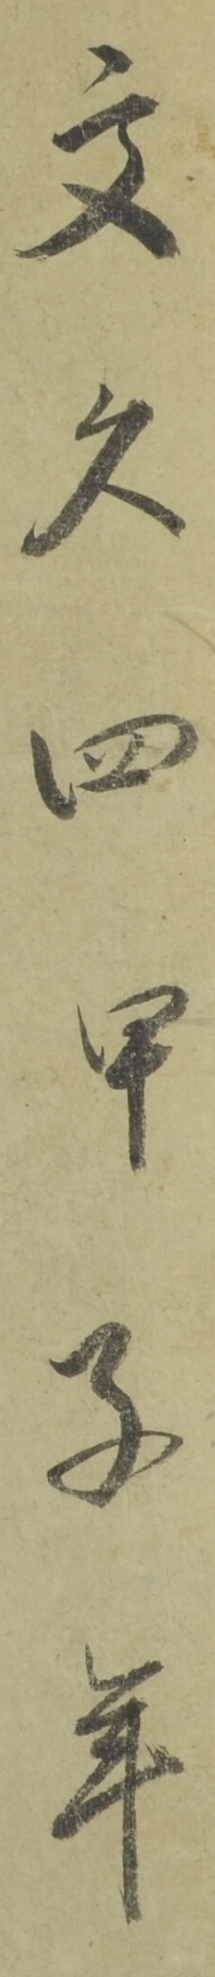文久四甲子年
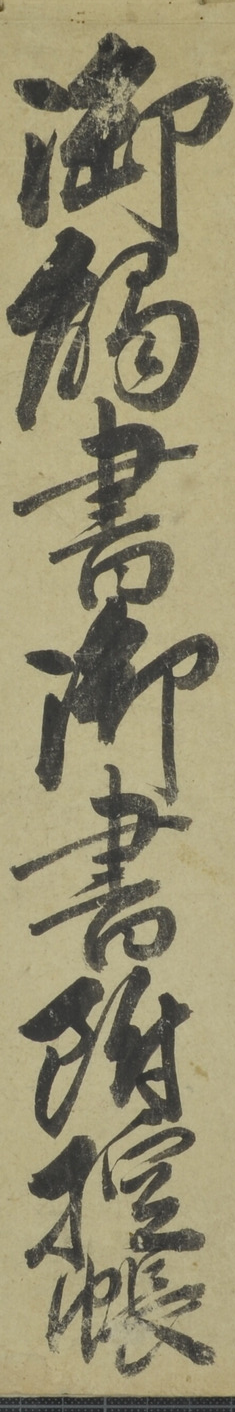御触書御書附控帳

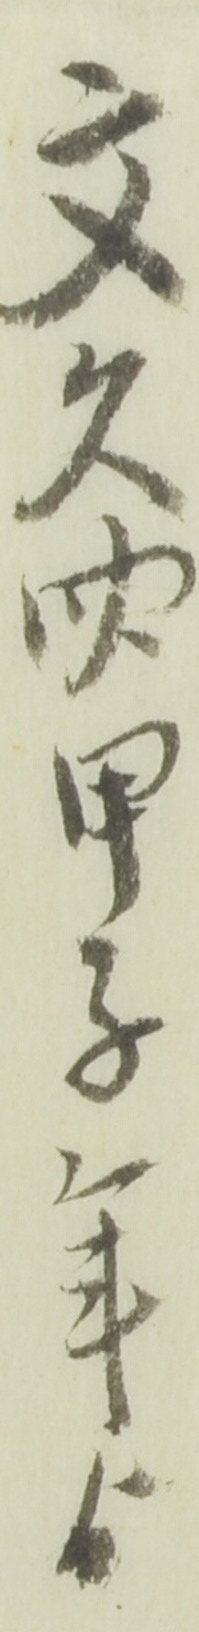文久四甲子年ゟ
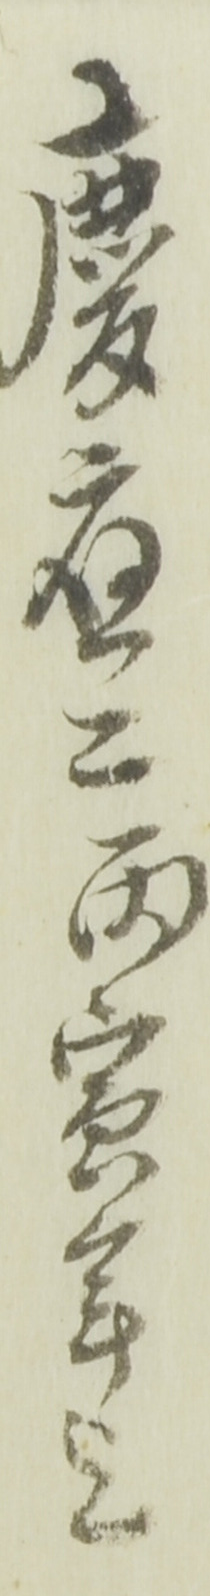慶応二丙寅年迄
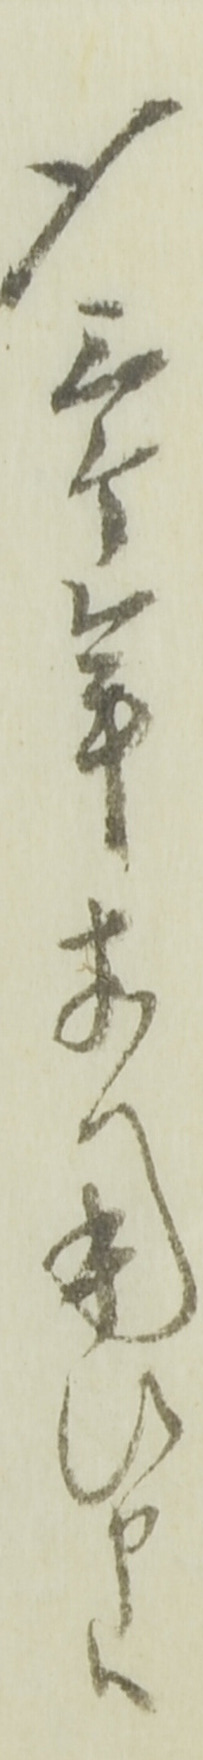〆三ケ年相用ひ申候
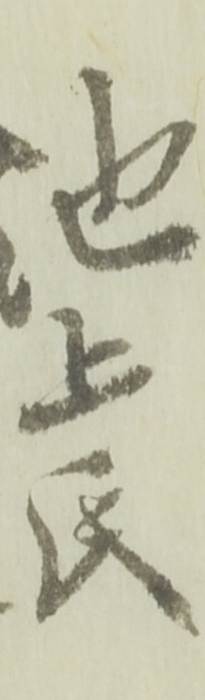池上氏

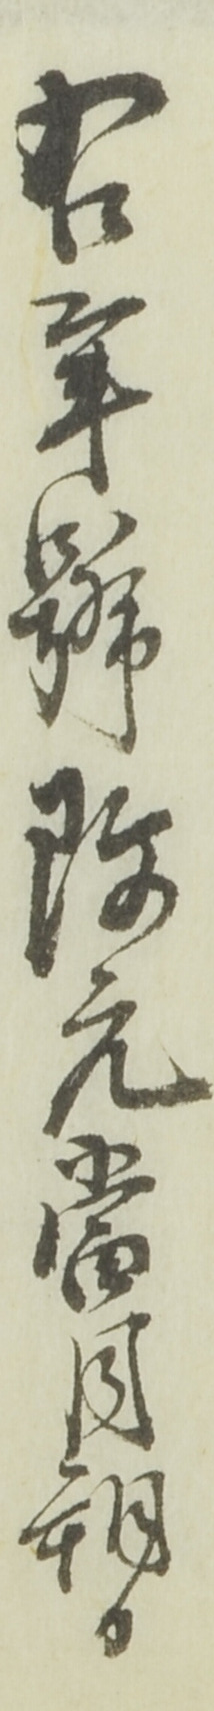右年号改元当月朔日
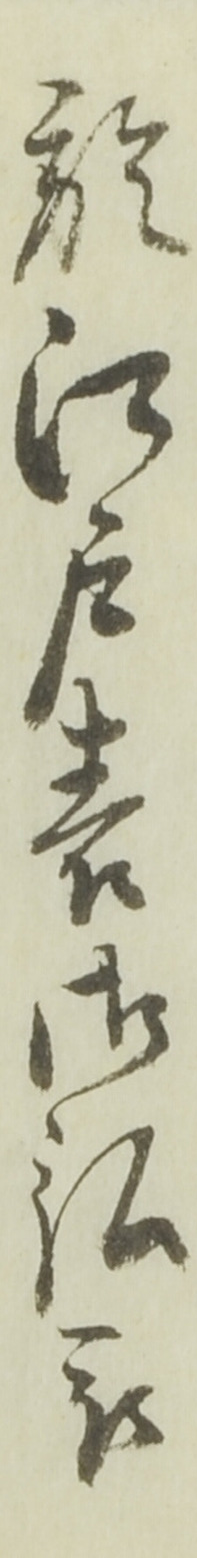於江戸表御弘被
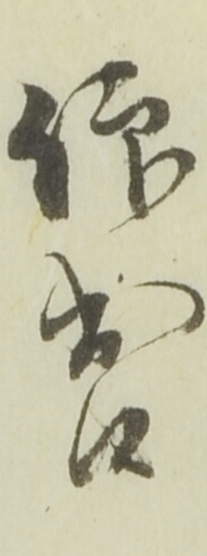仰出候
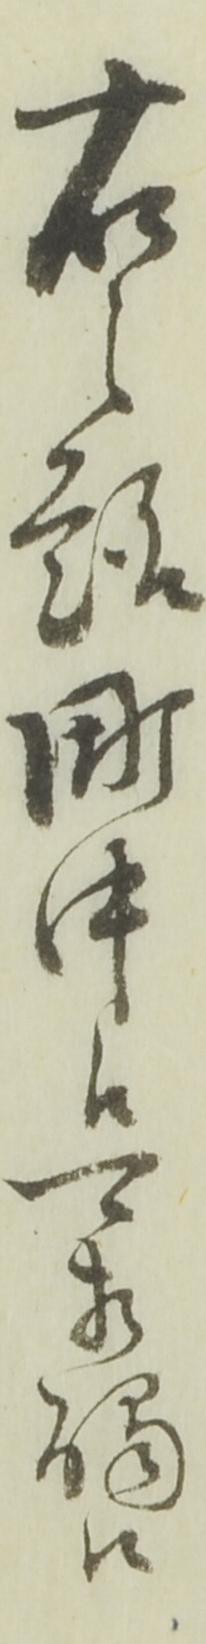右之趣町中江可相触候
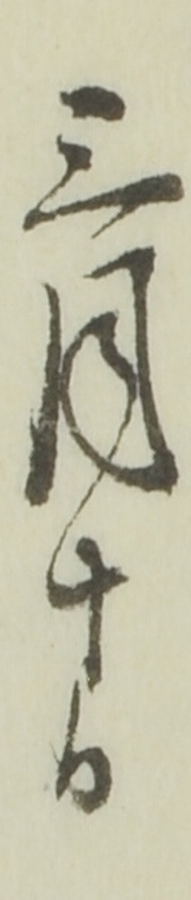三月十日
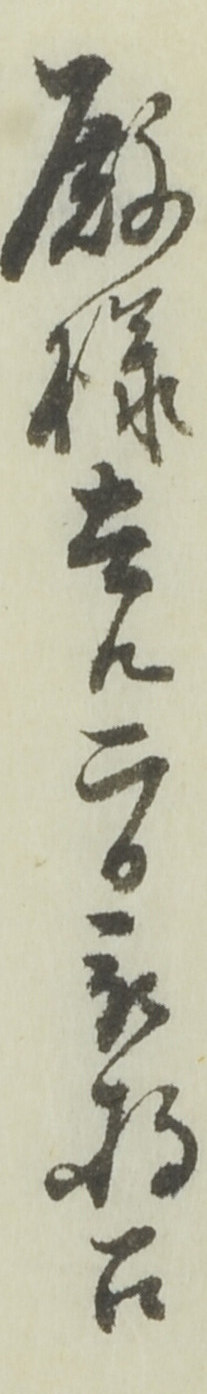殿様去ル二日被存召
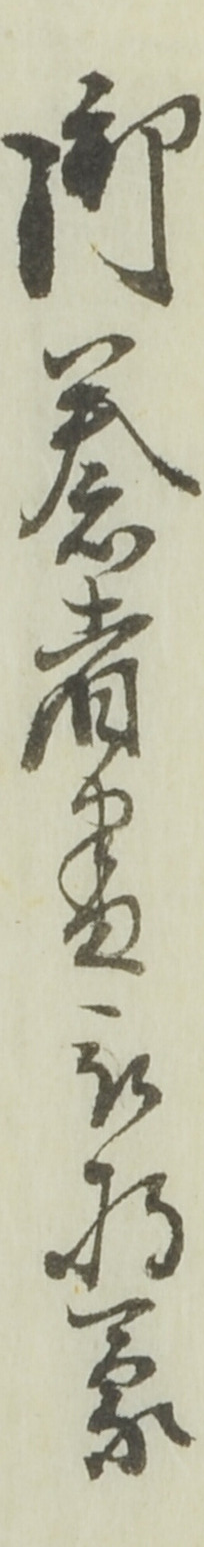御奏者番被為蒙
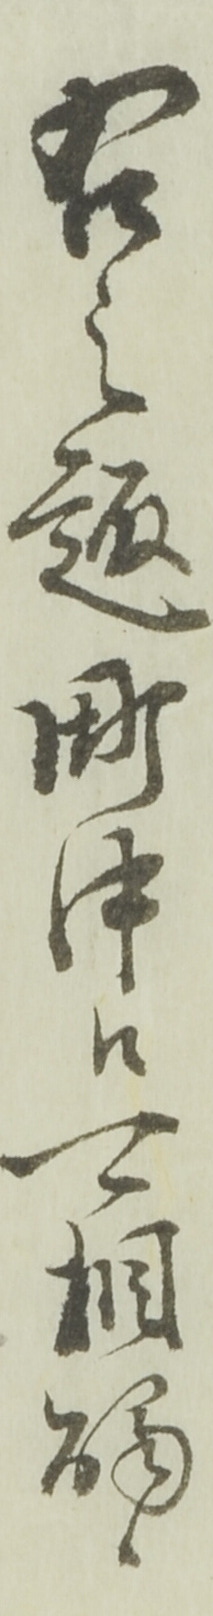右之趣町中江可相触候
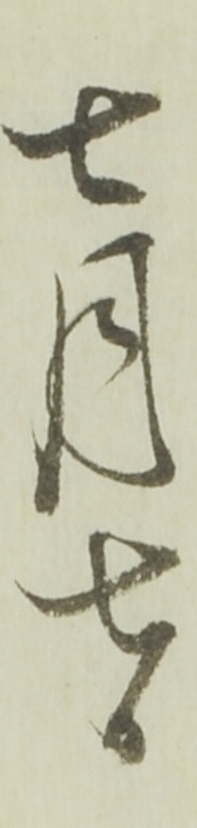七月七日

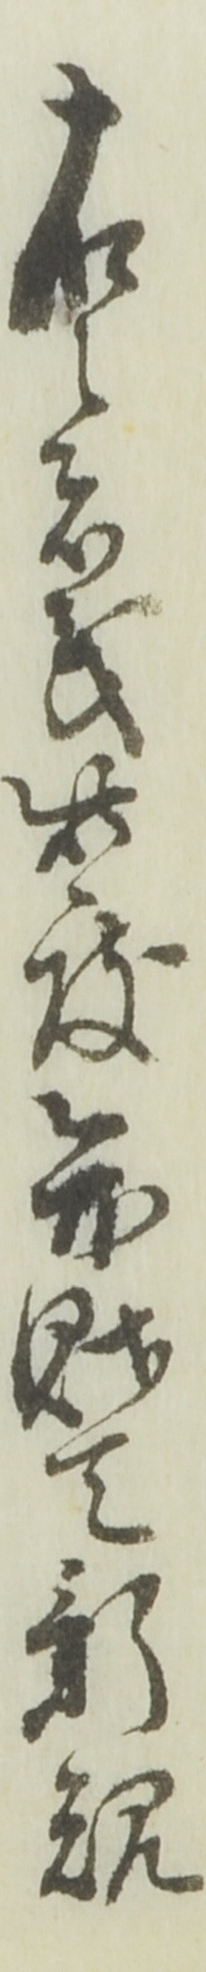右之者義此度弁財天新規
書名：御触書御書附控帳
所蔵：伊那市立高遠町図書館・合同会社AMANE
